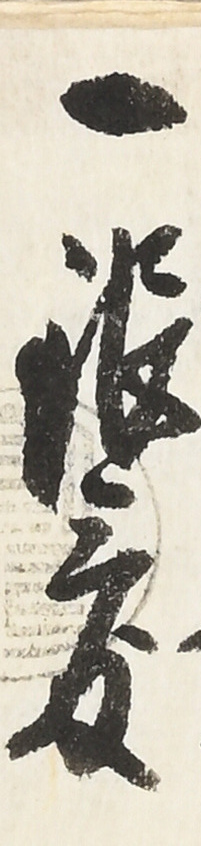一銀六匁
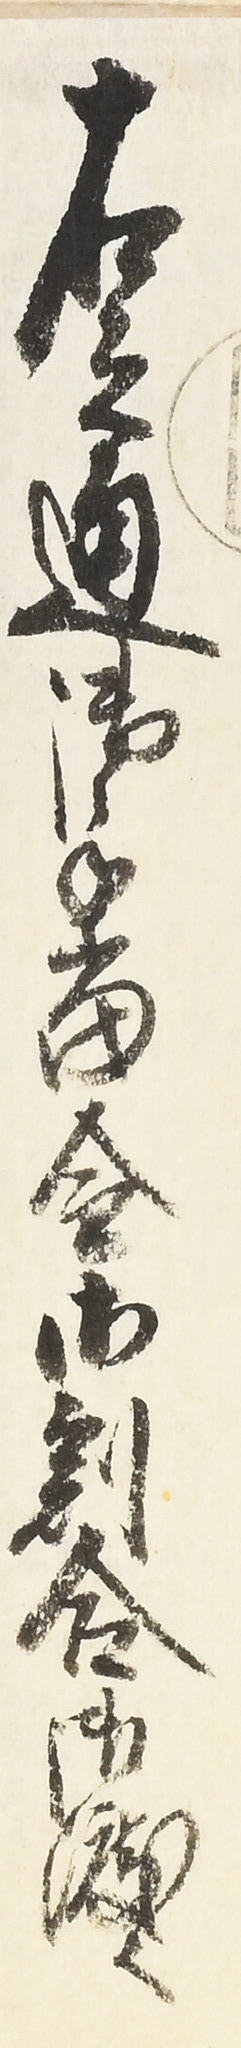右之通御手当金御割合御渡し
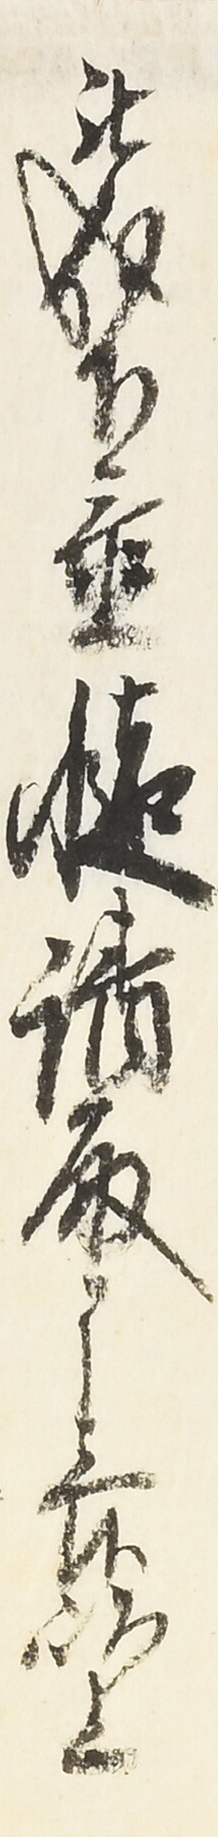被成下置慥請取申上候以上
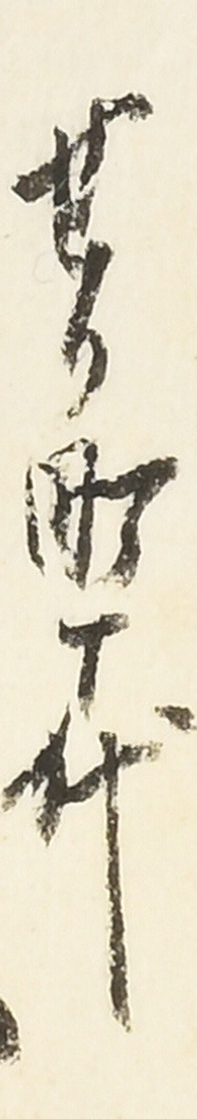せり町丁代
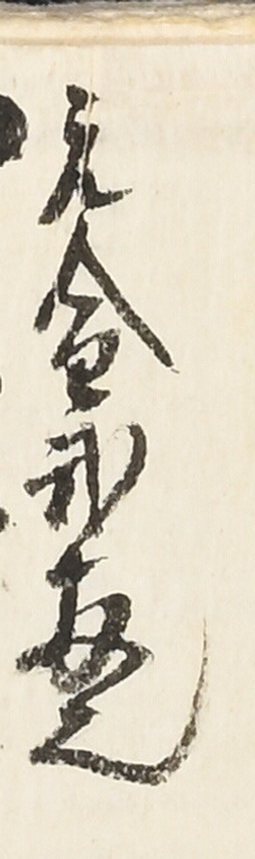元金壱両也
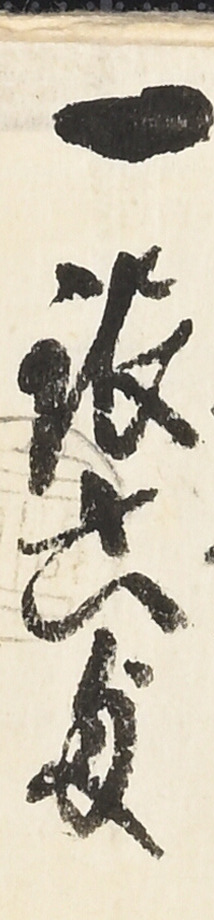一銀六匁
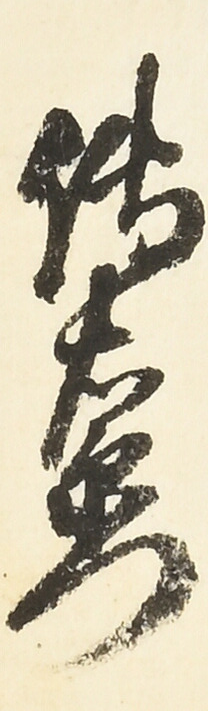伝右衛門
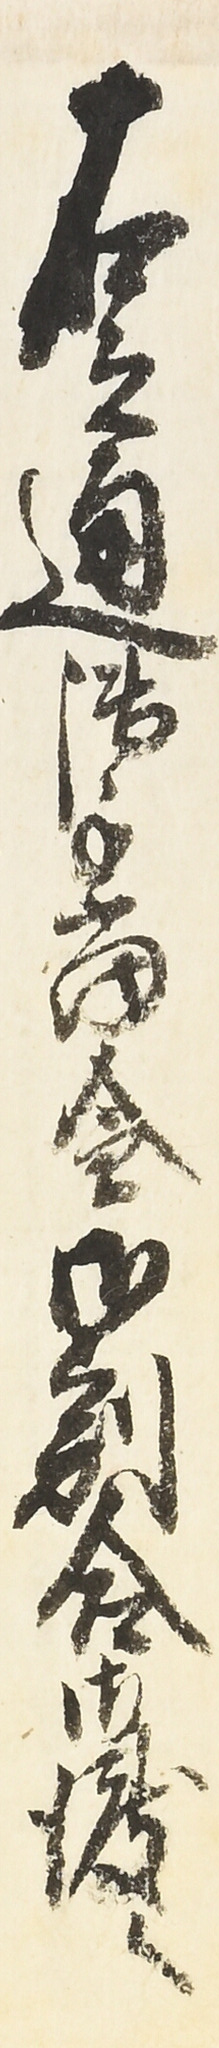右之通御手当金御割合御渡し
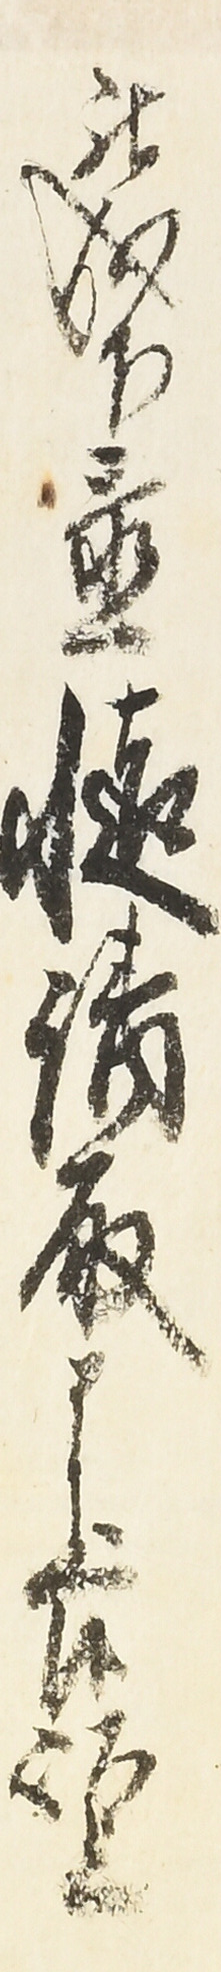被成下置慥請取申上候以上
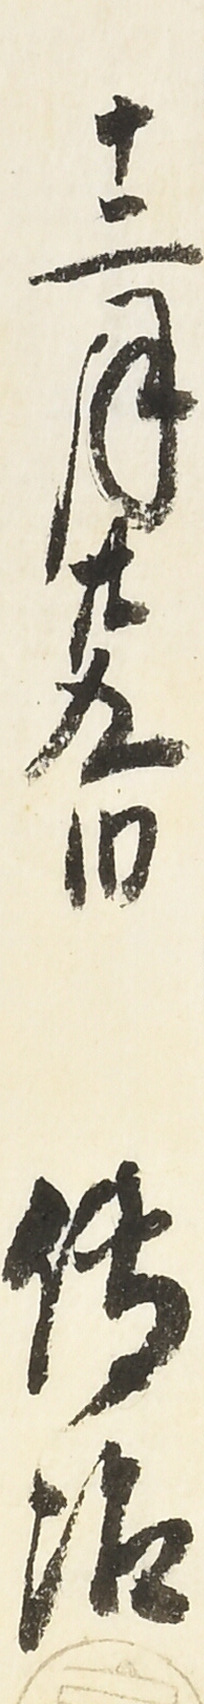十二月廿九日傳治

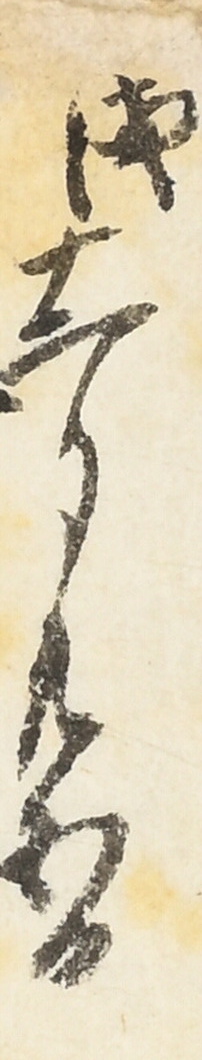戌十二月廿五日
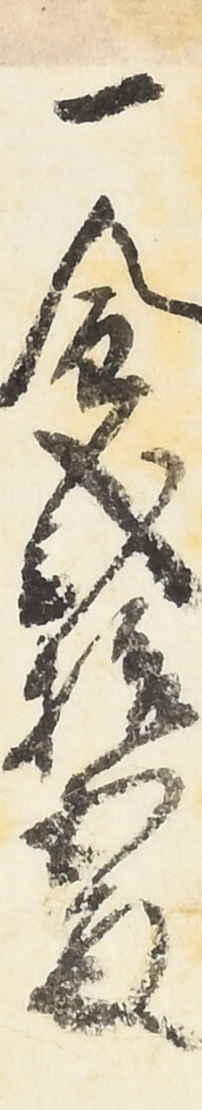一金弐拾五両
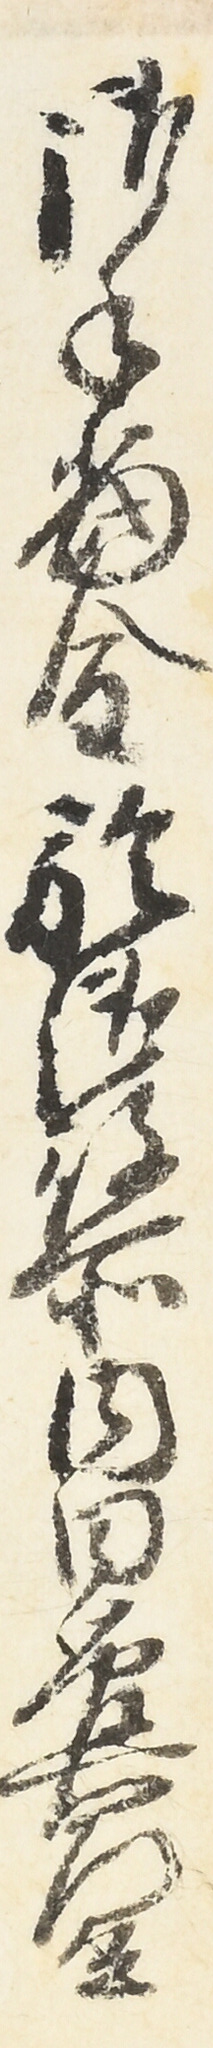御手当金於御役所内田菅右衛門殿
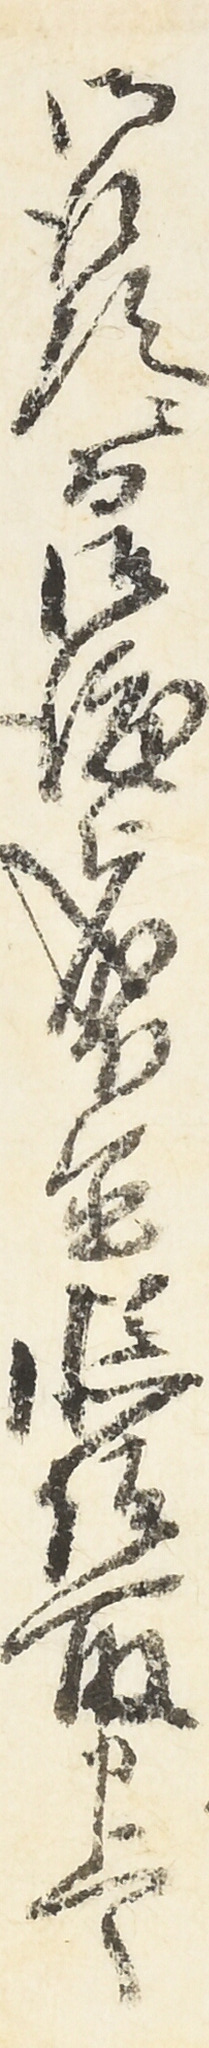御取次ニ而御渡被成下置慥請取申上候
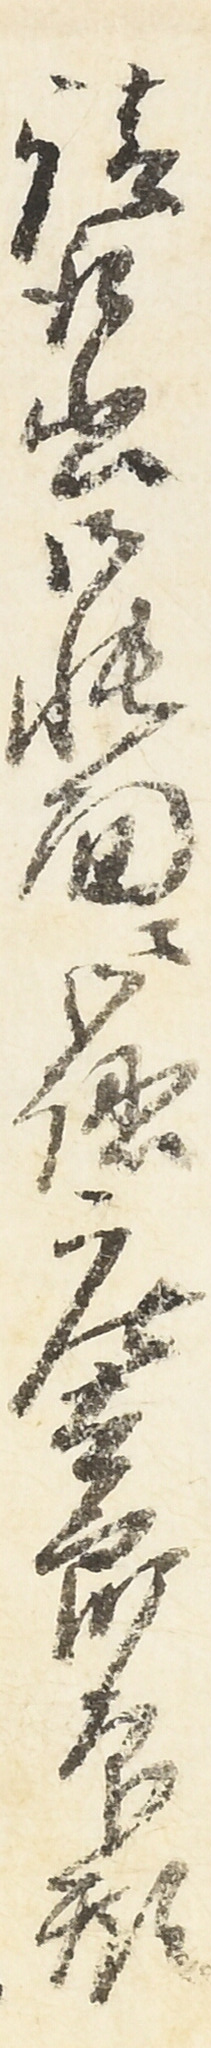請取書御帳面ニ御認庄兵衛印形
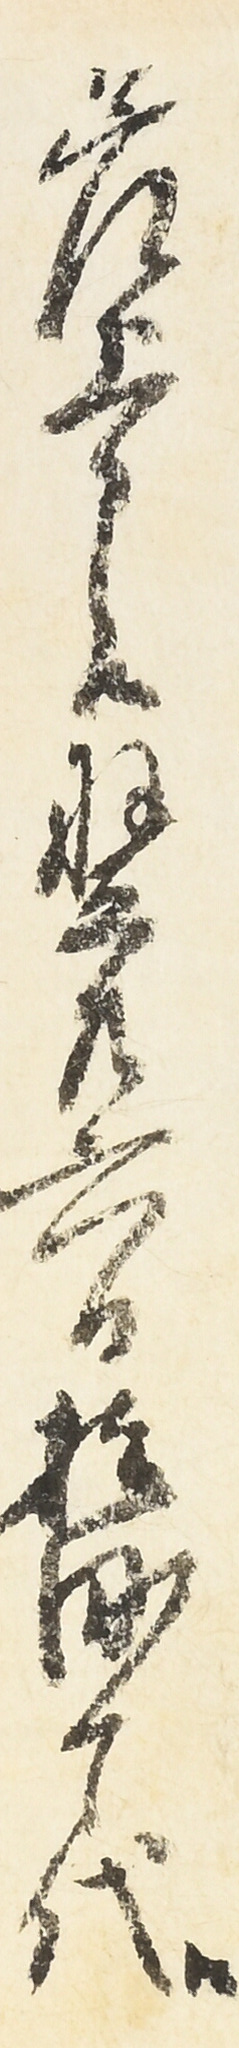差上申候翌廿六日横町町代江
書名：御才覚金御利足割渡扣帳
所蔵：伊那市立高遠町図書館・合同会社AMANE
